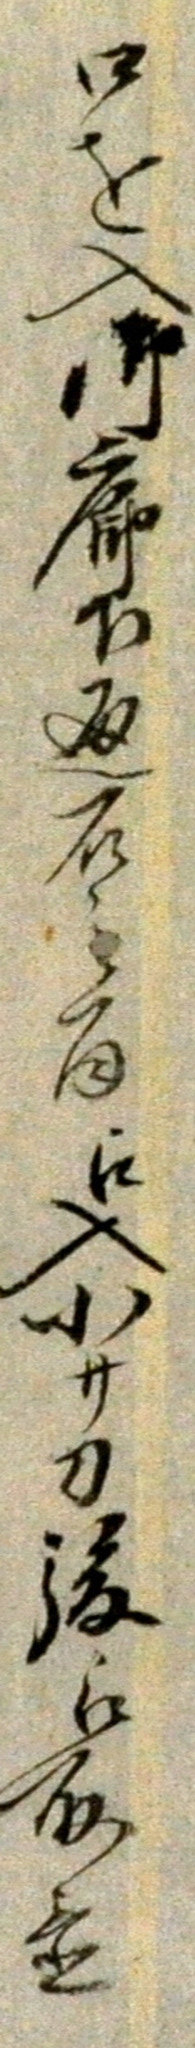口を入御廊下通石之間え入小サ刀後え取置
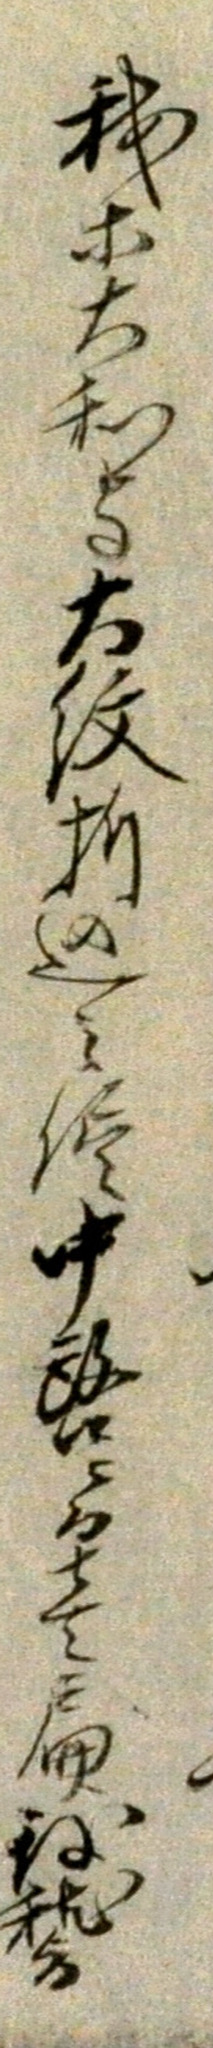我等大和守大紋折込之侭中啓ニ而壱遍致稽
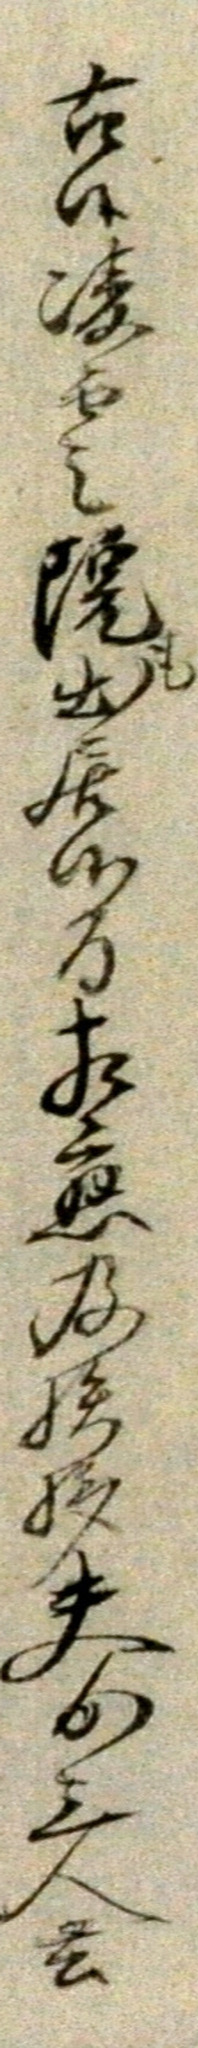古候凌雲院も出居候間相応及挨拶夫ゟ三人共
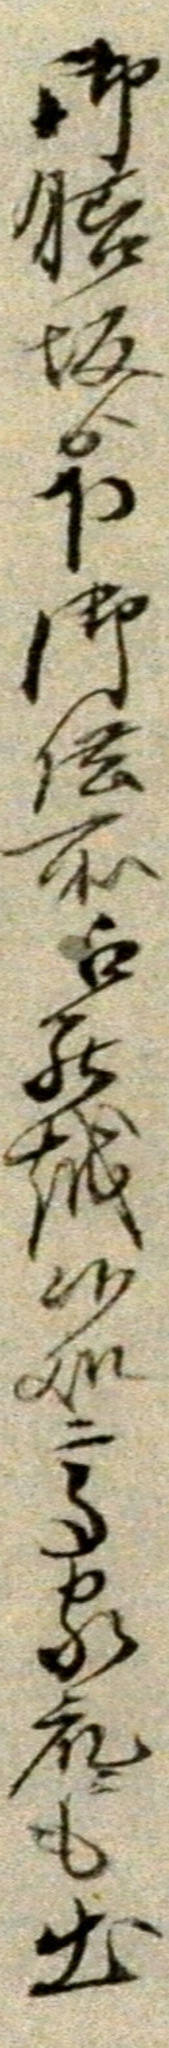御膳坂ゟ下御供所え罷越候処高家衆ニも出
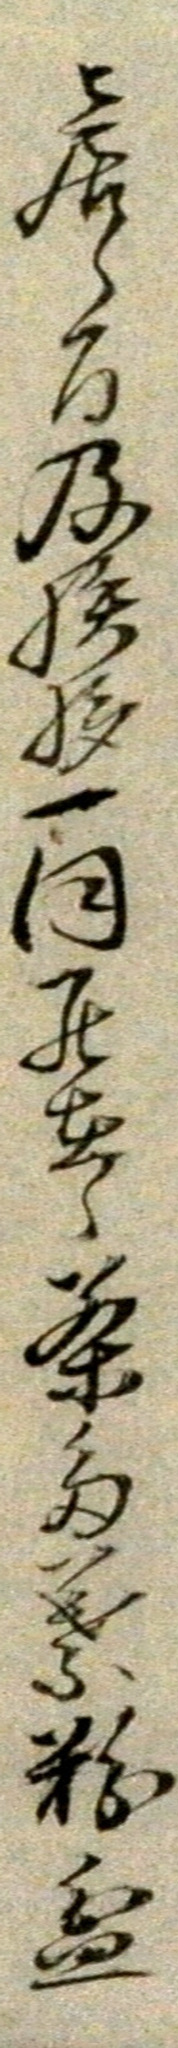被居候間及挨拶一同罷在候茶多葉粉盆
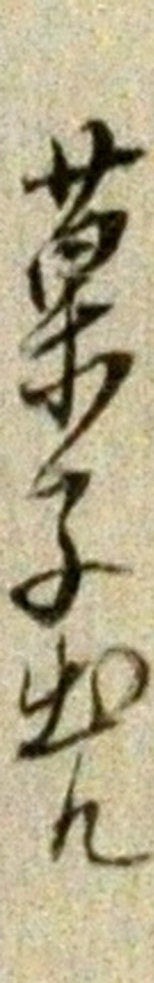菓子出ル

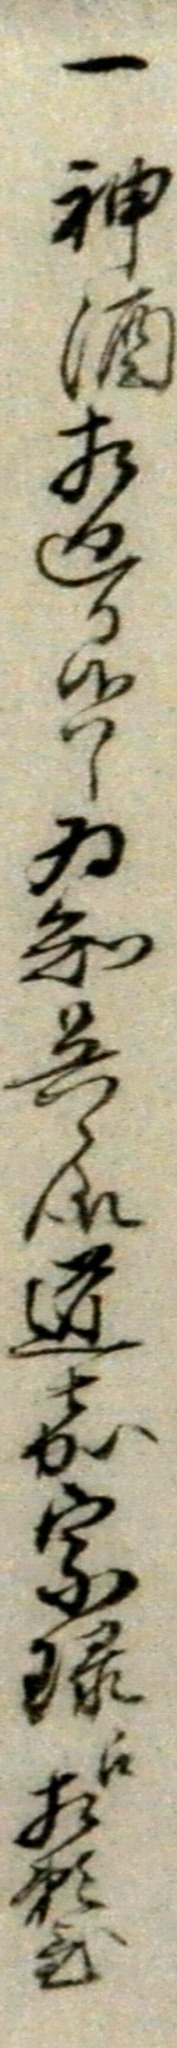一神酒相廻り候ハヽ為知呉候様道嘉宗録え相頼置
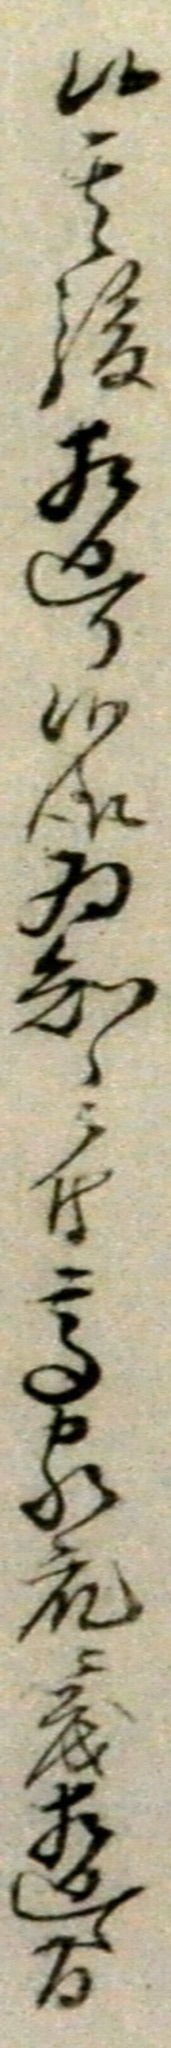候其後相廻り候様為知候ニ付高家衆ニも相廻候間
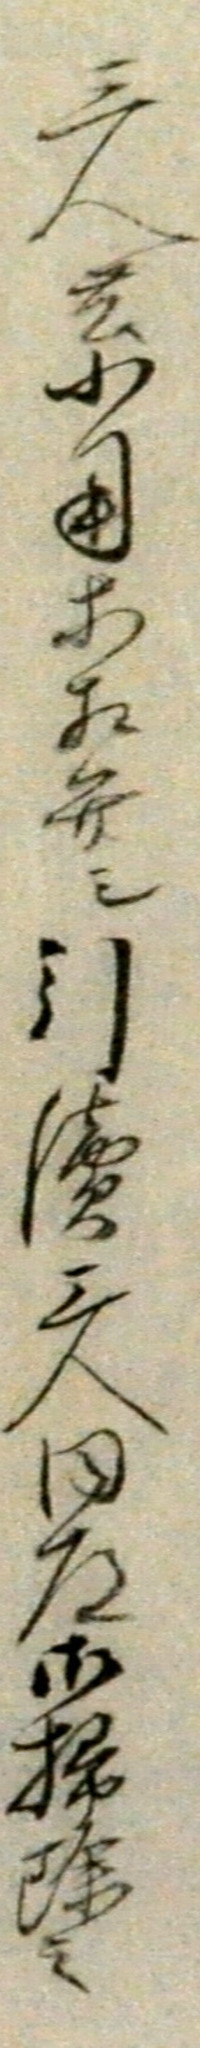三人共小用等相弁シ引続三人同道御掃除之
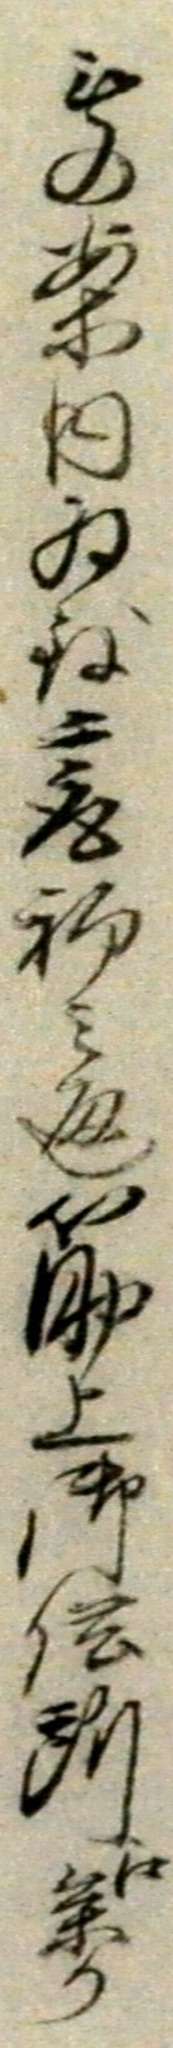もの案内為致最初之通筋上御供所え参り
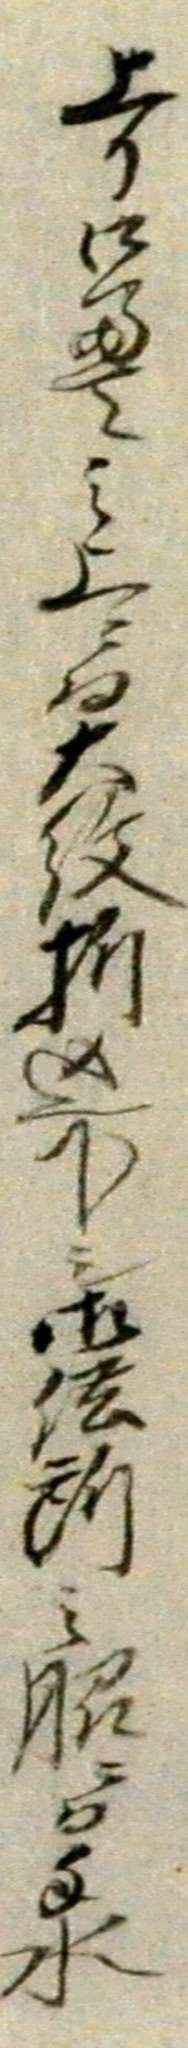上り口畳之上ニ而大紋折込下シ御供所之脇ニ而手水
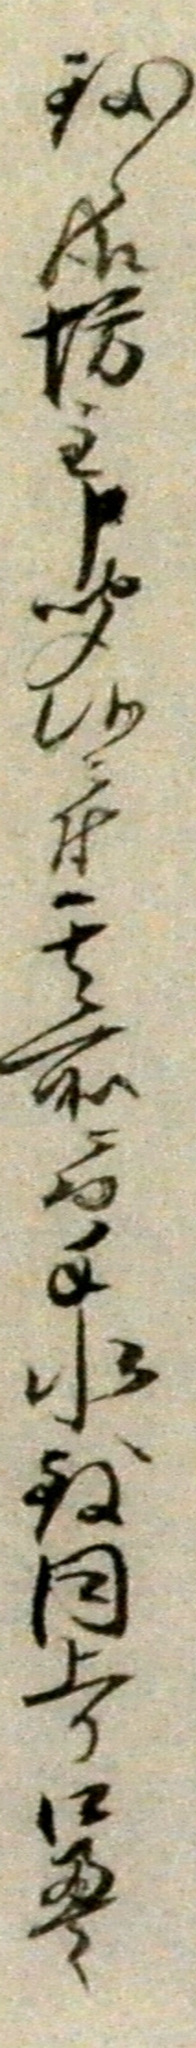致候様坊主申聞候ニ付其所ニ而手水致同上り口畳
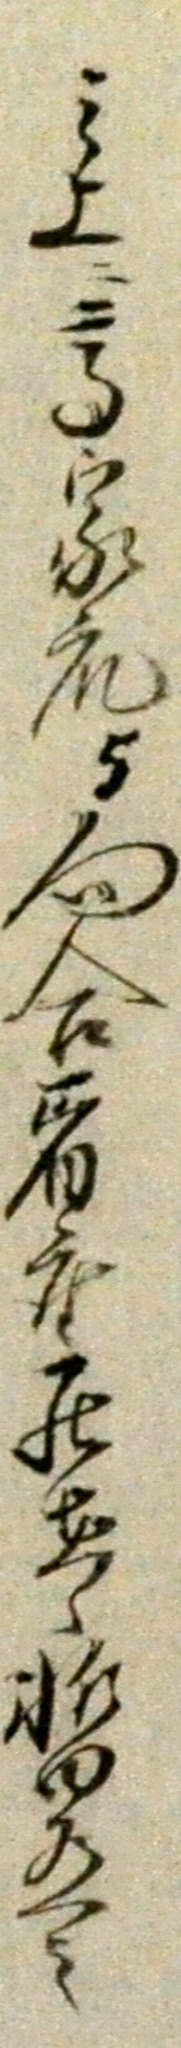之上ニ高家衆と向合着座罷在候暫有之
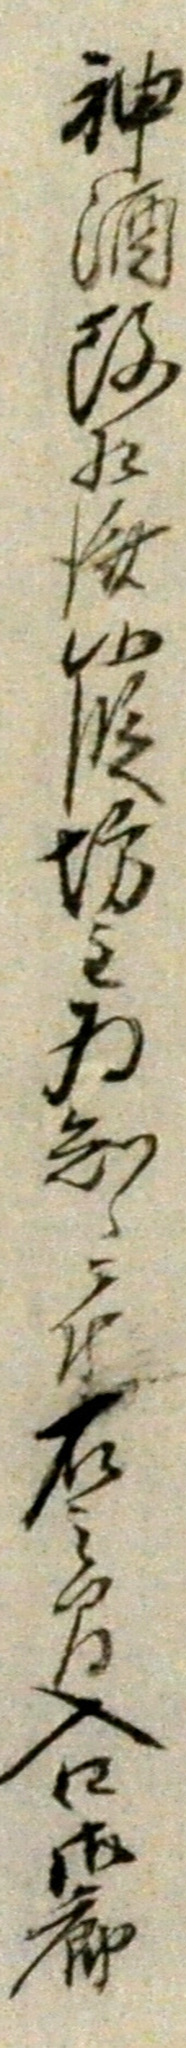神酒改相済候段坊主為知候ニ付石之間入口御廊
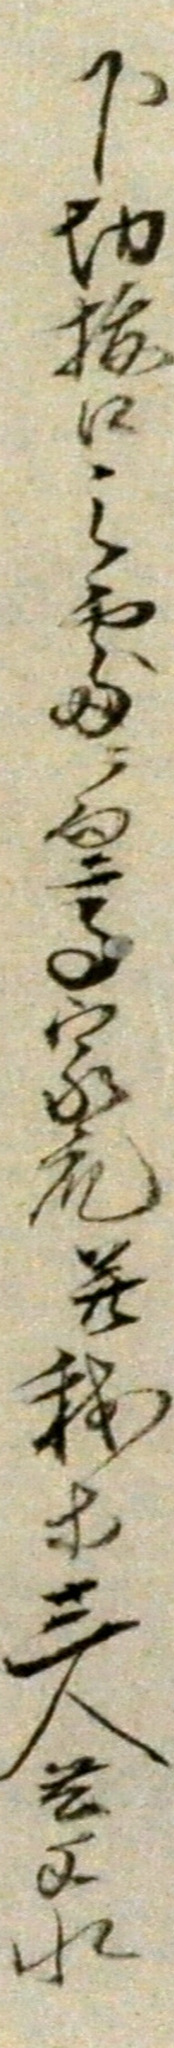下切抜口之処ニ而高家衆并我等三人共手水
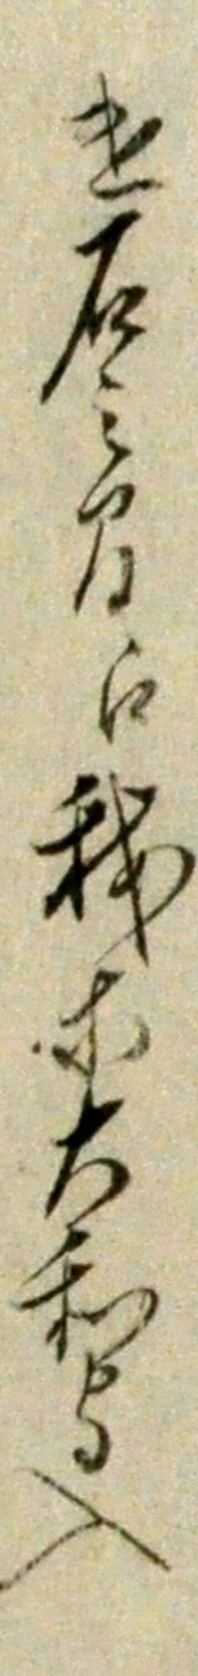遣石之間え我等大和守入
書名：御鏡餅御用留（写）
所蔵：伊那市立高遠町図書館・合同会社AMANE
